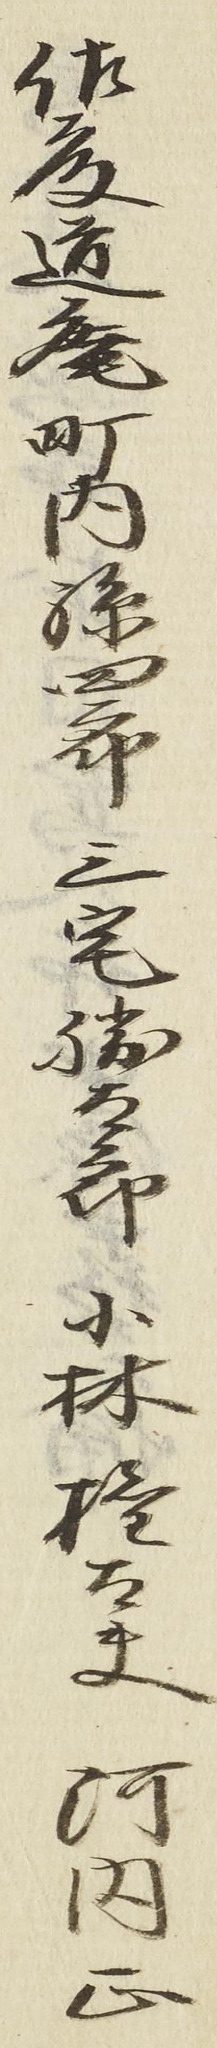佐藤道庵町内孫四郎三宅勝太郎小林権大夫河内正

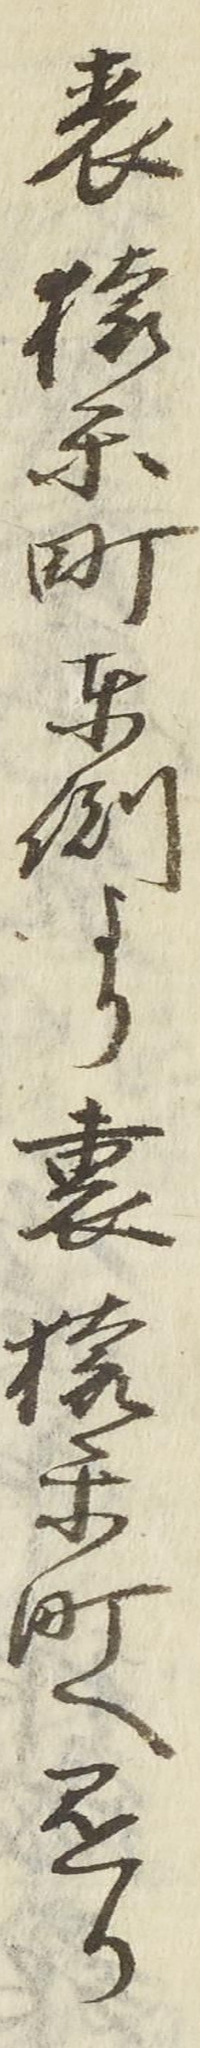表猿楽町東側より裏猿楽町へ懸り
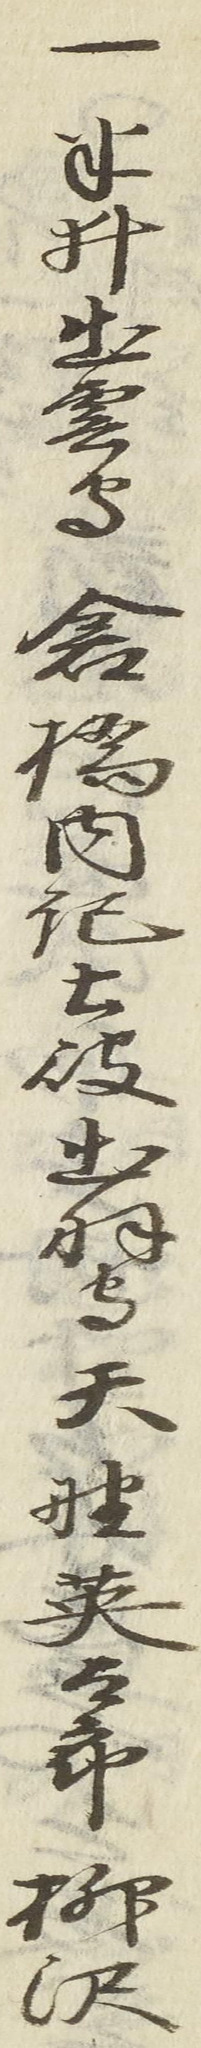一半井出雲守倉橋内記土岐出羽守天野英太郎柳沢
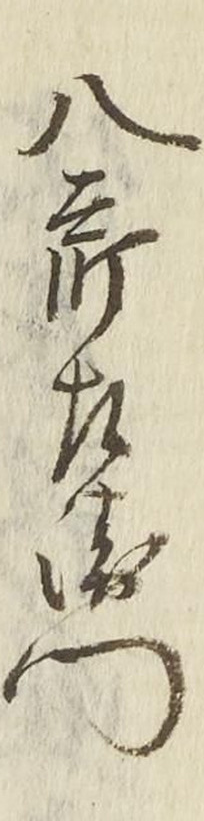八郎左衛門
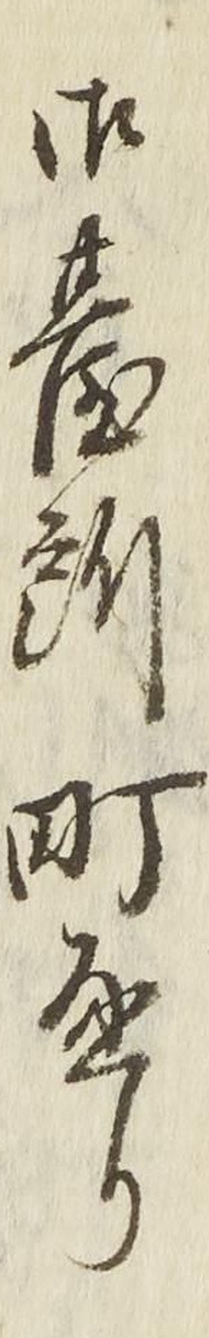御台所町通り
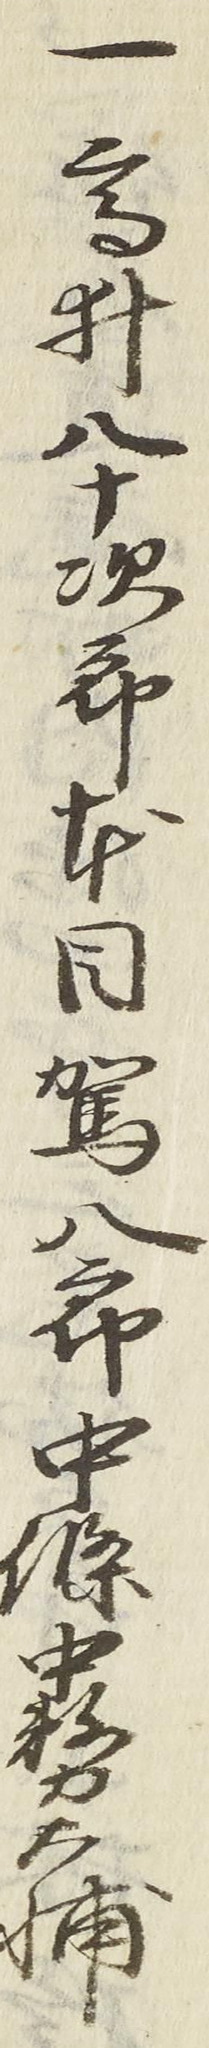一高井八十次郎本目駕八郎中條中務大輔
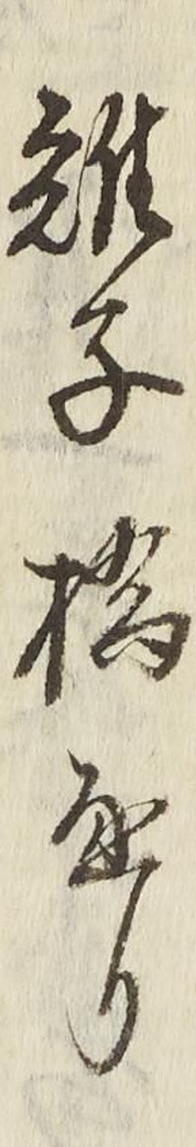雉子橋通り
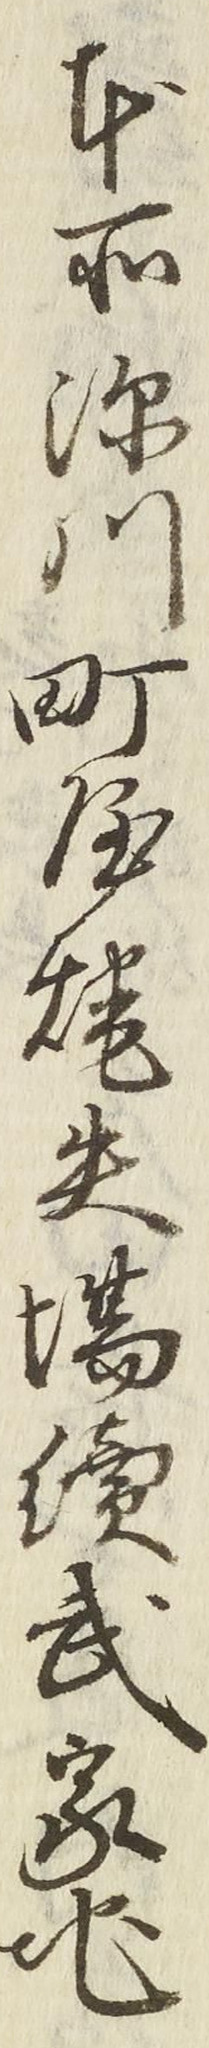本所深川町屋焼失場続武家地
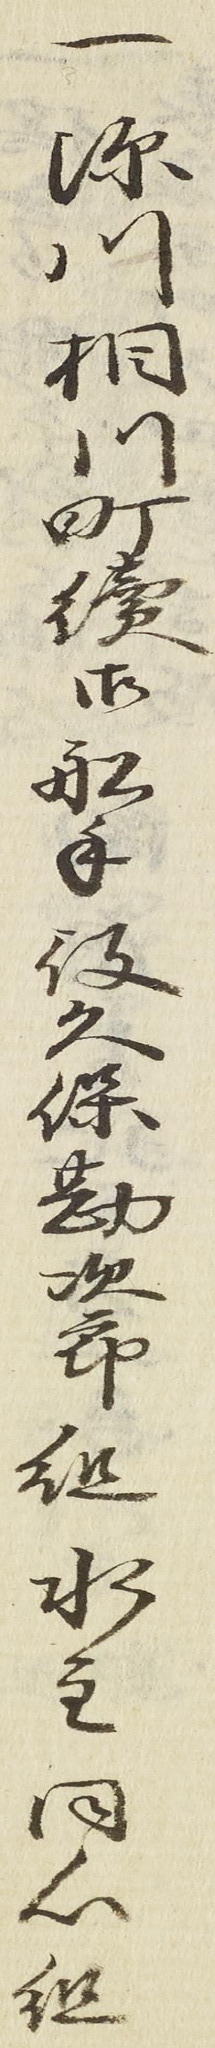一深川相川町続御船手役久保勘次郎組水主同心組
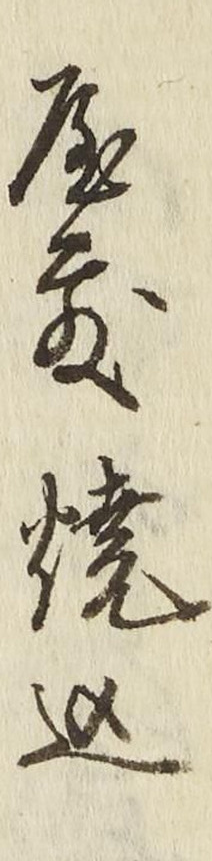屋敷焼込
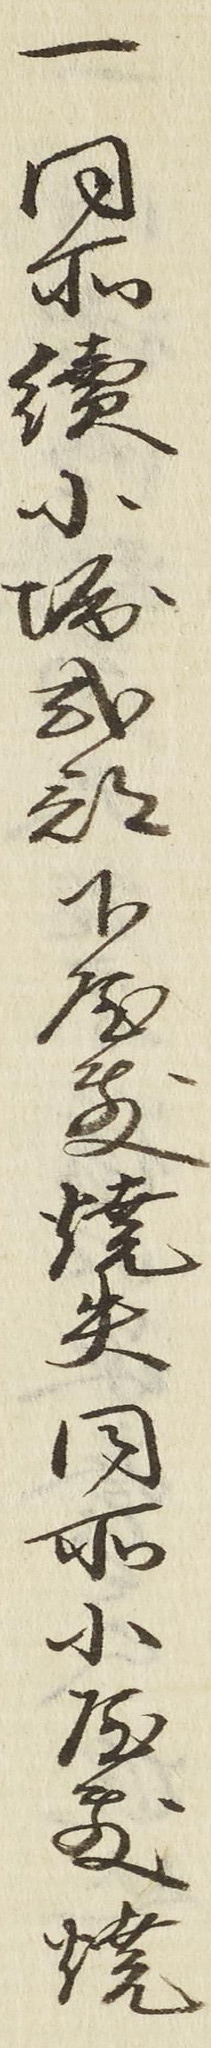一同所続小堀式部下屋敷焼失同所小屋敷焼
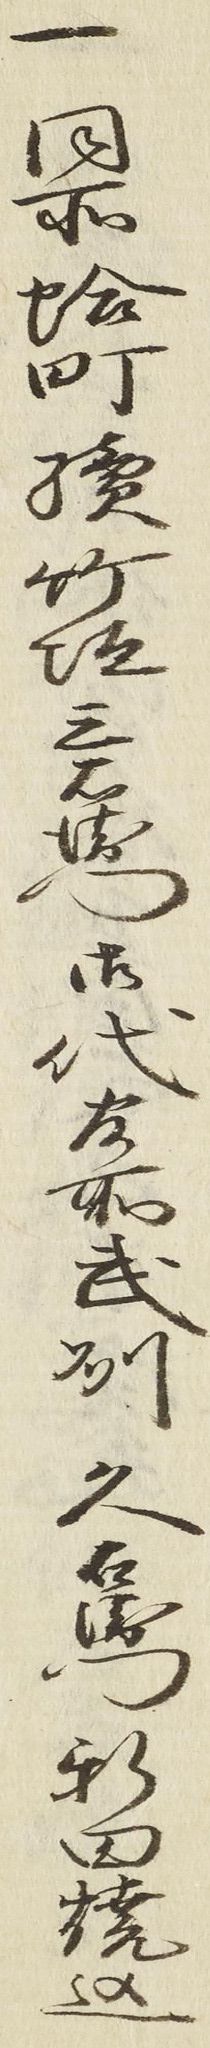一同所蛤町続竹垣三右衛門御代官所武州久右衛門新田焼込
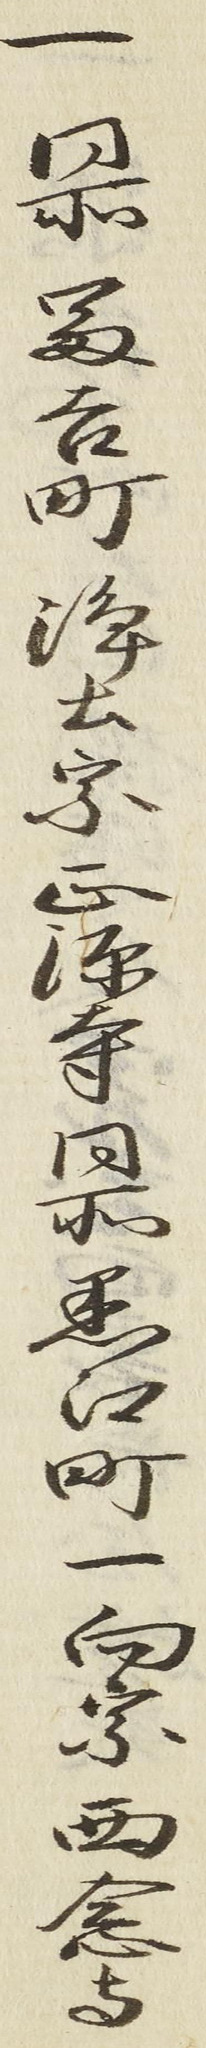一同所富吉町浄土宗正源寺同所黒江町一向宗西念寺
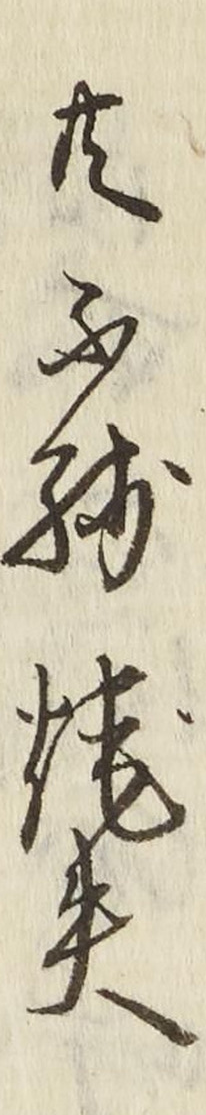共不残焼失
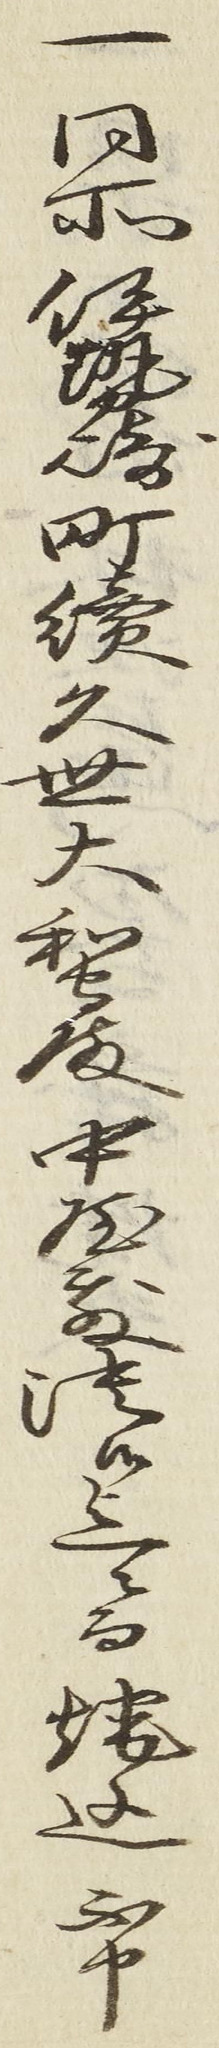一同所伊勢崎町続久世大和守殿中屋敷潰候迄にて焼込不申
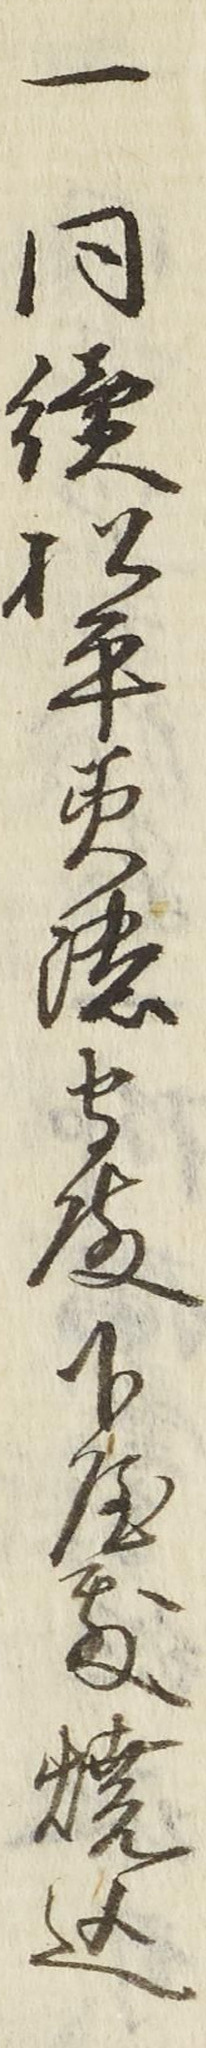一同続松平美濃守殿下屋敷焼込
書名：やぶれ窓の記　全
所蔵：東京大学地震研究所図書室 Earthquake Research Institute Library, The University of Tokyo, JAPAN
